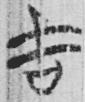吉
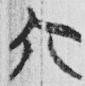六
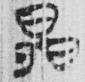晶
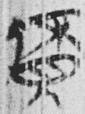○（負）
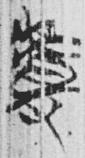摣
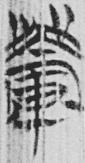𨍱（乘）
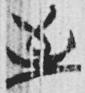至（致）
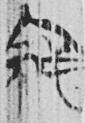○（寇）
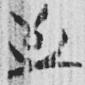至
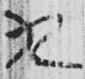九
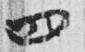四
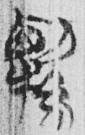繲（解）
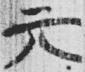亓（其）
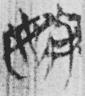拇
